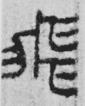飛
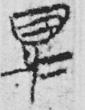鳥
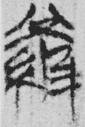羅（離）
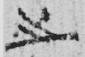之
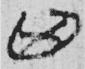凶
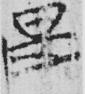是
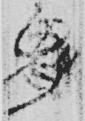{胃刀}（謂）
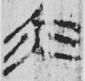亦
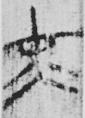○（災）
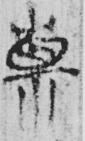○（眚）
